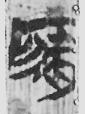肩
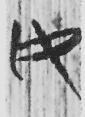女
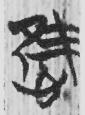惟
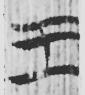王
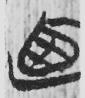廼
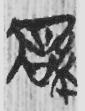{人言糸}
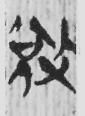敓（說）
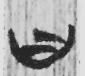曰
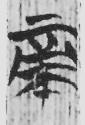帝
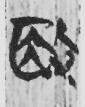殹
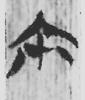尔
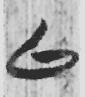㠯（以）
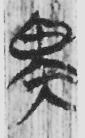畀
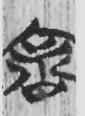{余口}（余）
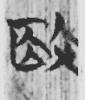殹
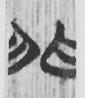非
